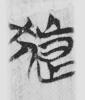狼
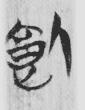飤
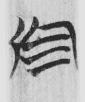於
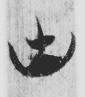山
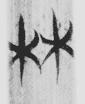林
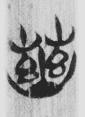{艸幽}
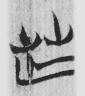芒
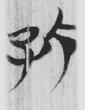孤
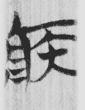疾
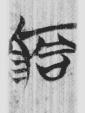痌
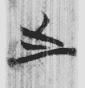之
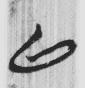㠯（以）
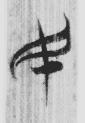民
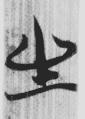生
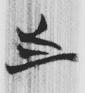之
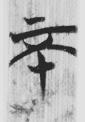不
